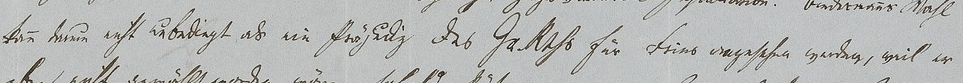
kann darum nicht unbedingt als ein Präjudiz des Gr. Rths für Fries angesehen werden, weil er
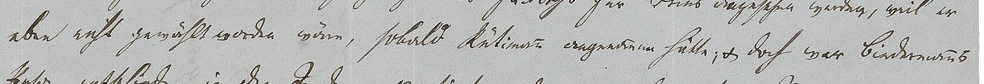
eben nicht gewählt worden wäre, sobald Rütimann angenommen hätte; & doch war Biedermanns
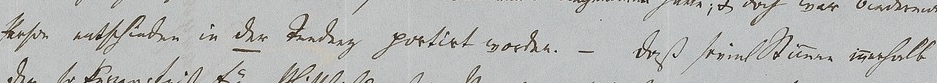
Person entschieden in der Tendenz portirt worden. – Daß soviel Stimmen innerhalb
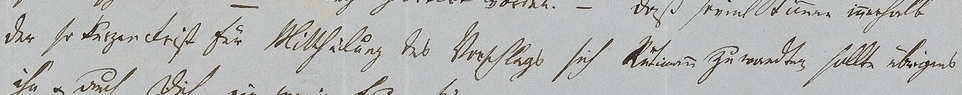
der so kurzen Frist für Mittheilung des Vorschlags sich Rütimann zuwandten, sollte übrigens
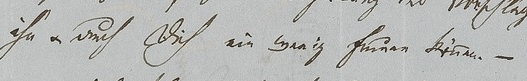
ihn & auch Dich ein wenig freuen können. –
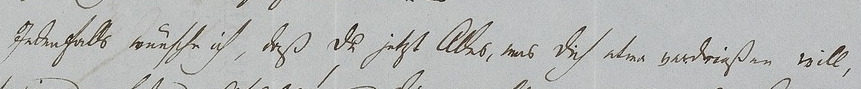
Jedenfalls wünsche ich, daß Du jetzt Alles, was Dich etwa verdrießen will,
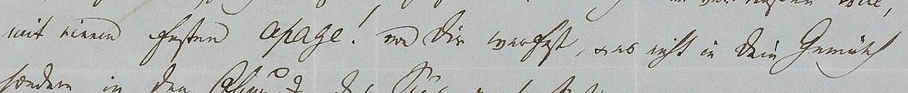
mit einem festen Apage! von Dir werfest, & es nicht in dein Gemüth
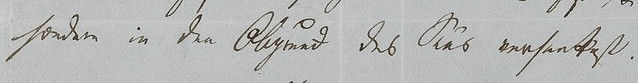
sondern in den Abgrund des See's versenkest.
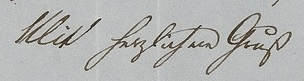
Mit herzlichem Gruß
